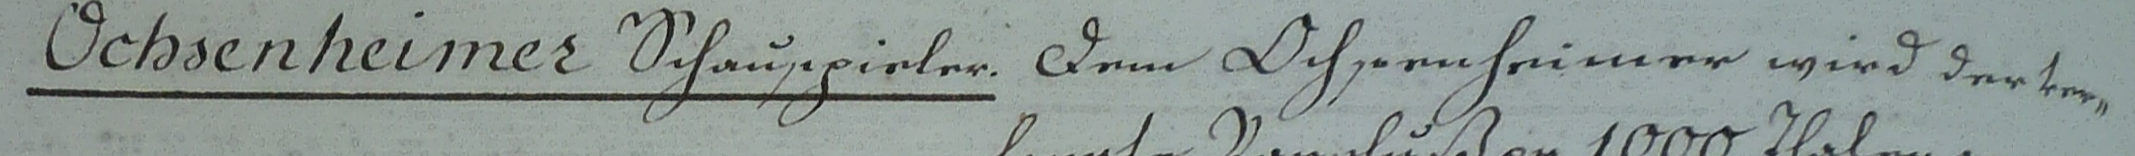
Ochsenheimer Schauspieler. Dem Ochsenheimer wird der ver¬
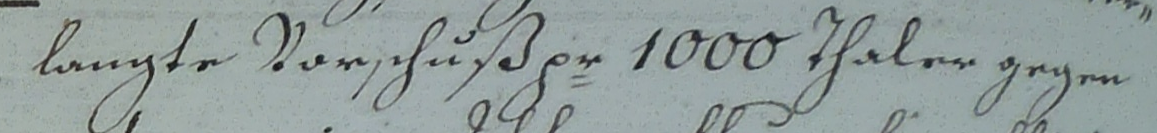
langte Vorschuß pr 1000 Thaler gegen
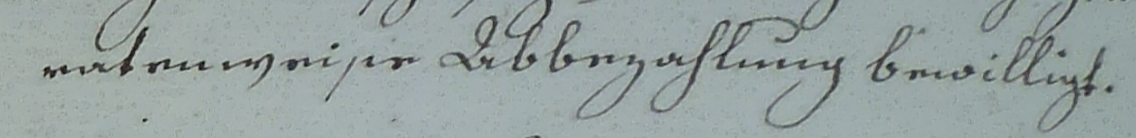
ratenweise Abbezahlung bewilligt.
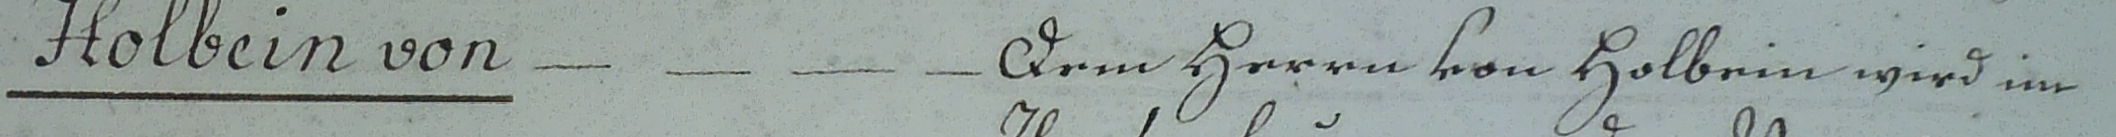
Holbein von _ _ _ _ Dem Herrn von Holbein wird im
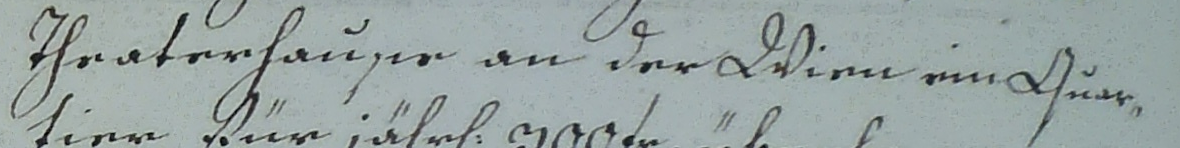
Theaterhause an der Wien ein Quar¬
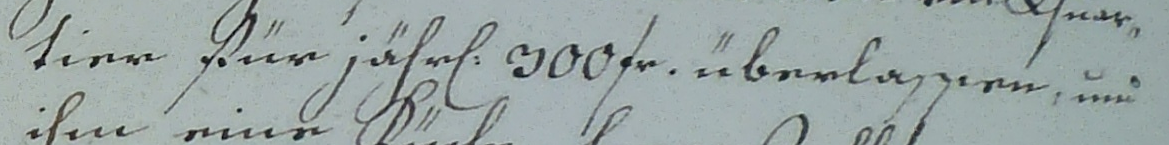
tier für jährE: 300fr. überlassen, und
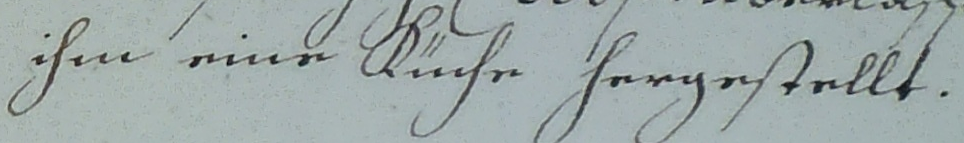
ihm eine Küche hergestellt.
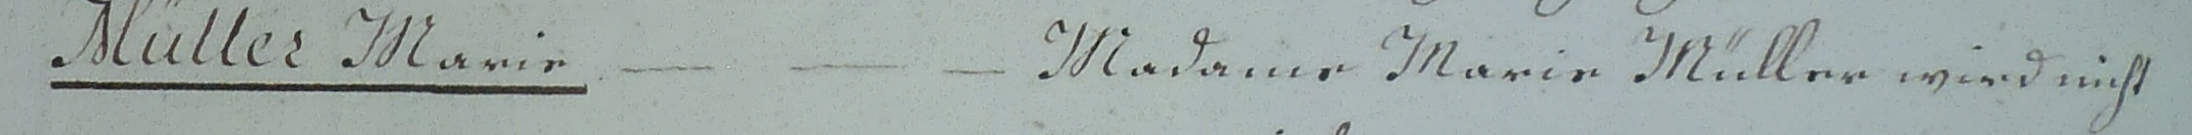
Müller Marie _ _ _ Madame Marie Müller wird nicht
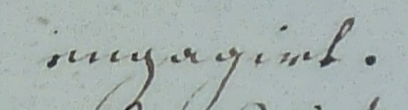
engagirt.
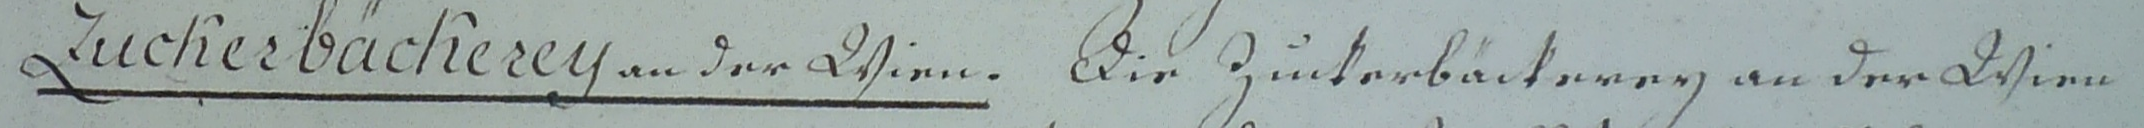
Zuckerbäckerey an der Wien. Die Zuckerbäckerey an der Wien
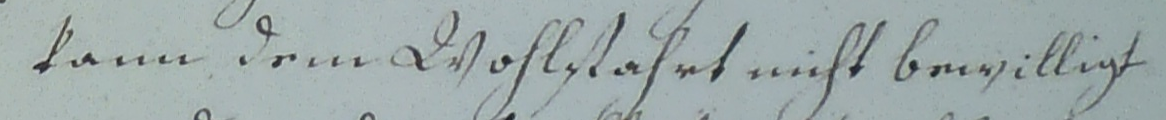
kann dem Wohlfahrt nicht bewilligt
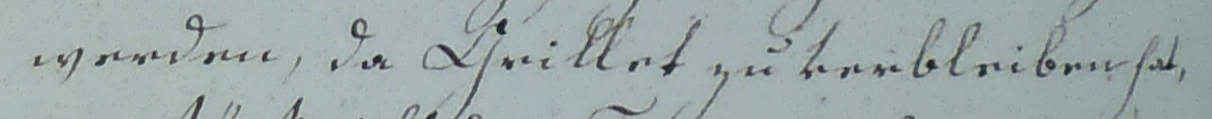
werden, da Grillet zu verbleiben hat,
